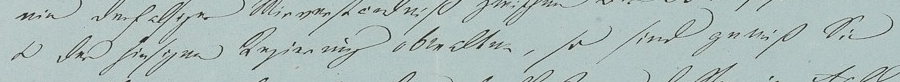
& der hiesigen Regierung obwalten, so sind gewiß Sie
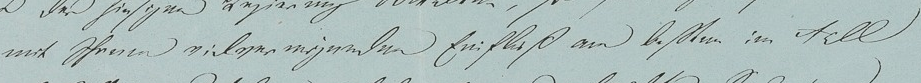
mit Ihrem vielvermögenden Einfluß am beßten im Fall
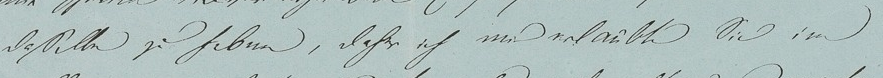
dasselbe zu heben, daher ich mir erlaubte Sie im
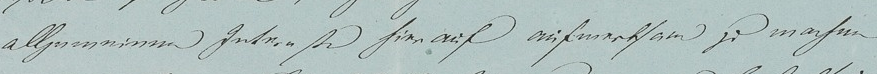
allgemeinen Intereße hierauf aufmerksam zu machen
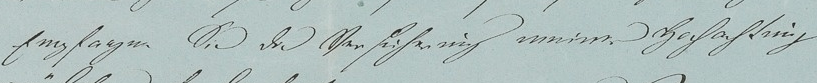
Empfangen Sie die Versicherung meiner Hochachtung
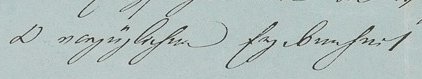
& vorzüglichen Ergebenheit
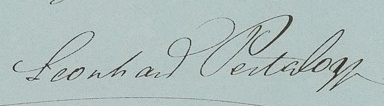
Leonhard Pestalozzi
